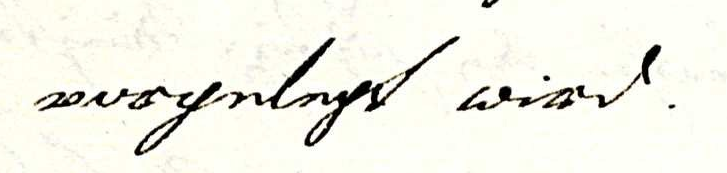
vorgelegt wird.
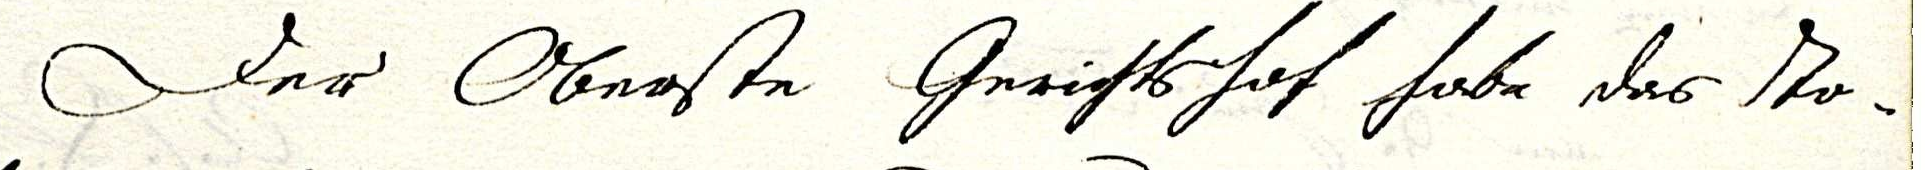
Der Oberste Gerichtshof habe das To¬
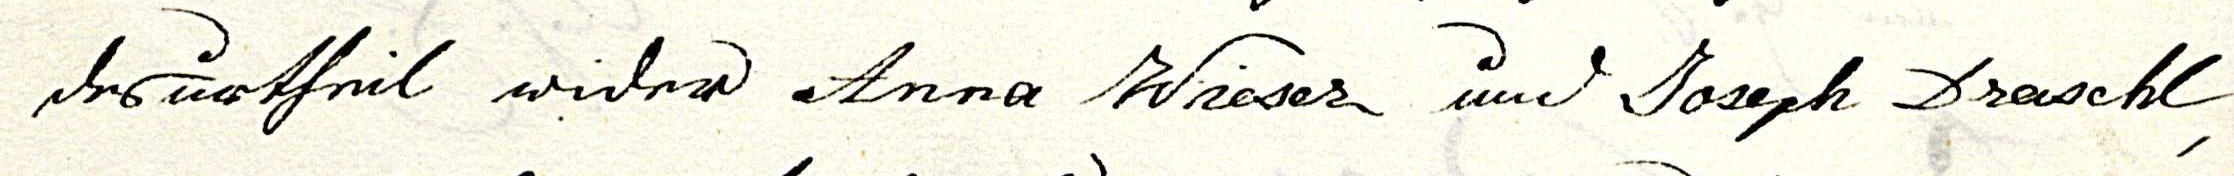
desurtheil wider Anna Wieser und Joseph Draschl,
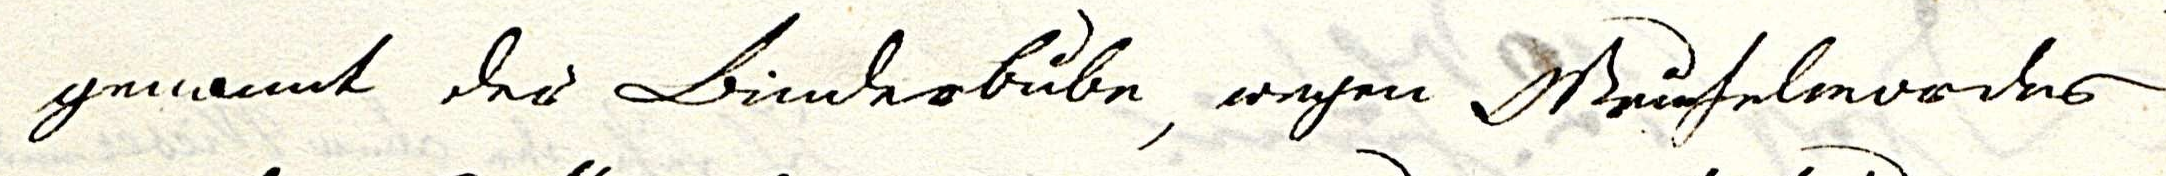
genannt der Binderbube, wegen Meuchelmordes
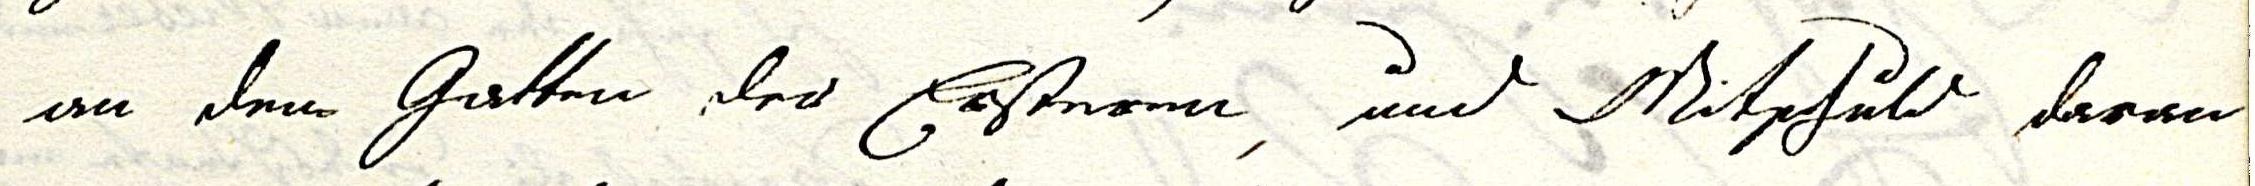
an den Gatten der Ersteren, und Mitschuld deren
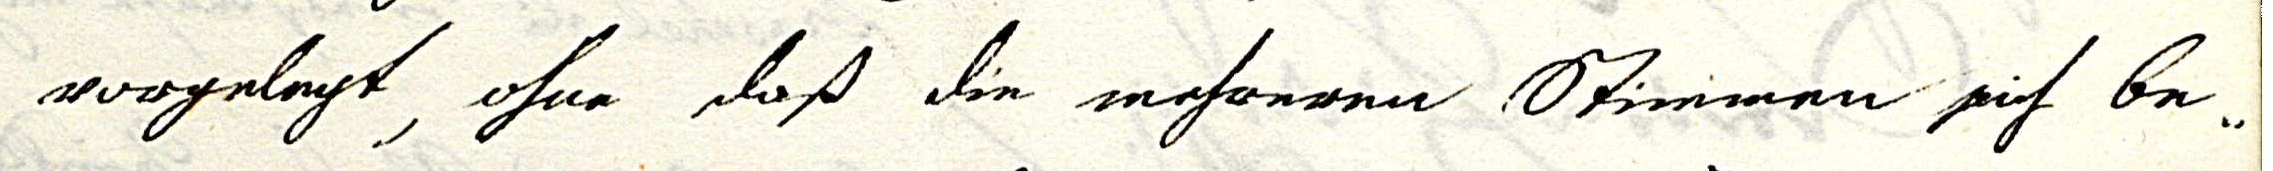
vorgelegt, ohne daß die mehreren Stimmen sich be¬
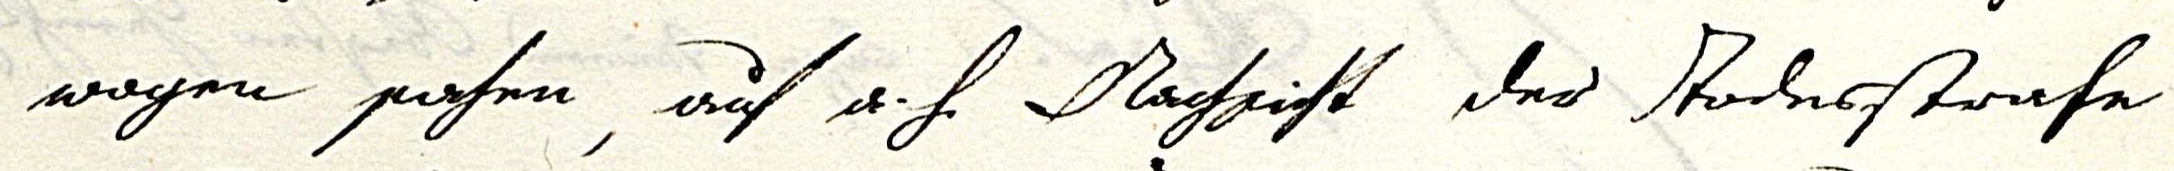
wogen sahen, auf a.h. Nachsicht der Todesstrafe
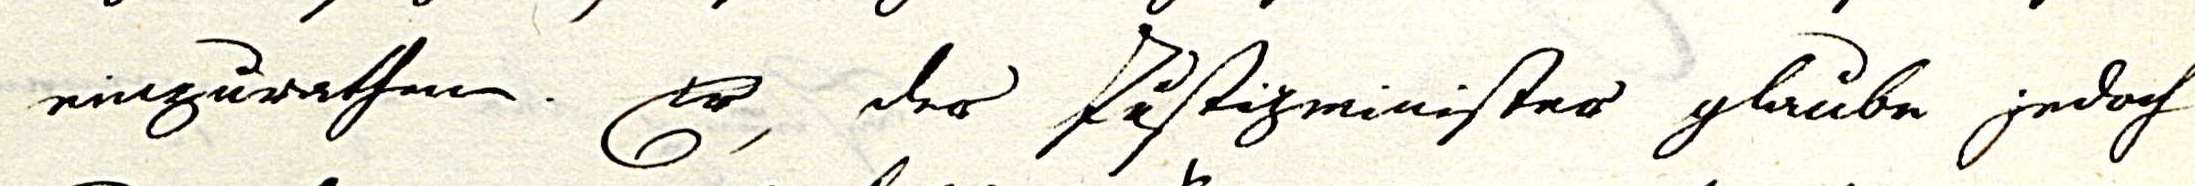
einzurathen. Er, der Justizminister, glaube jedoch
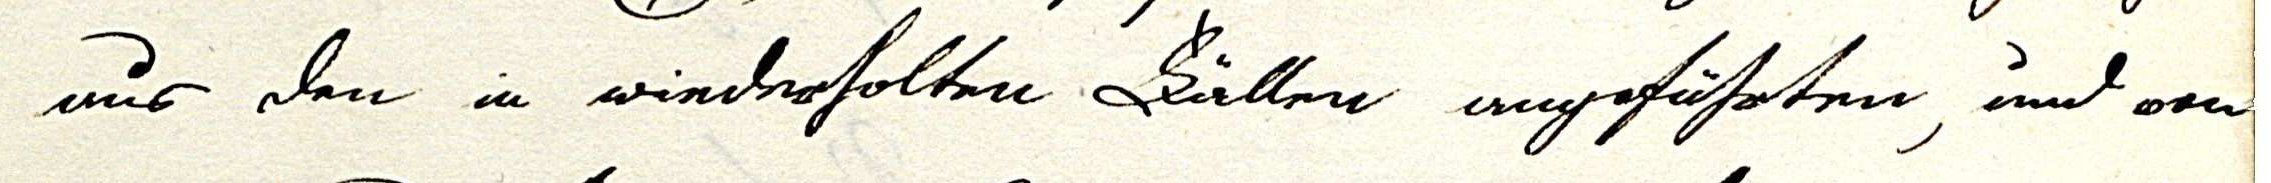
aus den in wiederholten Fällen angeführten, und vom
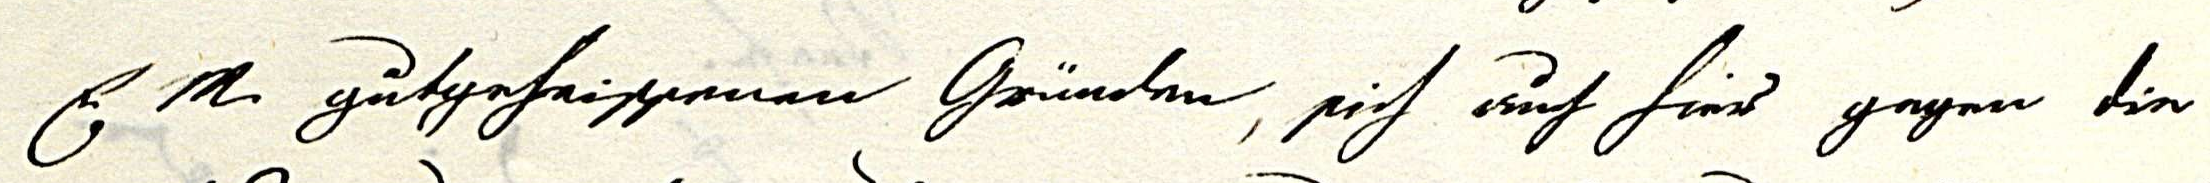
E.M. gutgeheissenen Gründen, sich auch hier gegen die
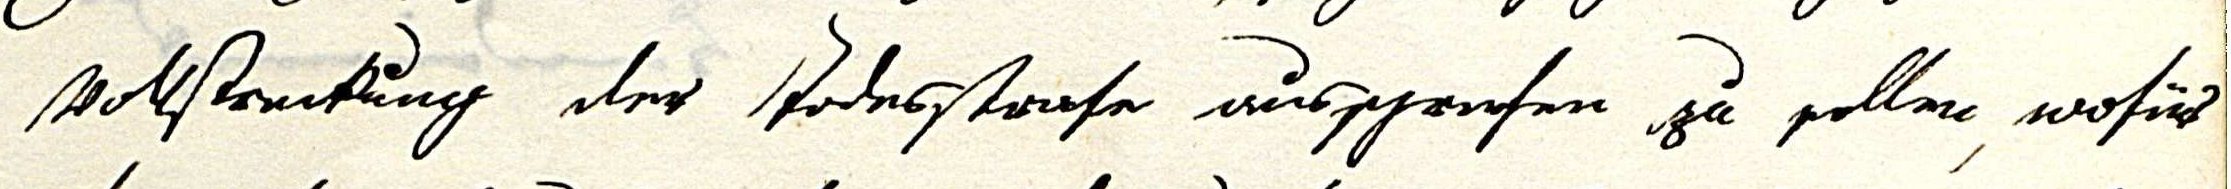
Vollstreckung der Todesstrafe aussprechen zu sollen, wofür
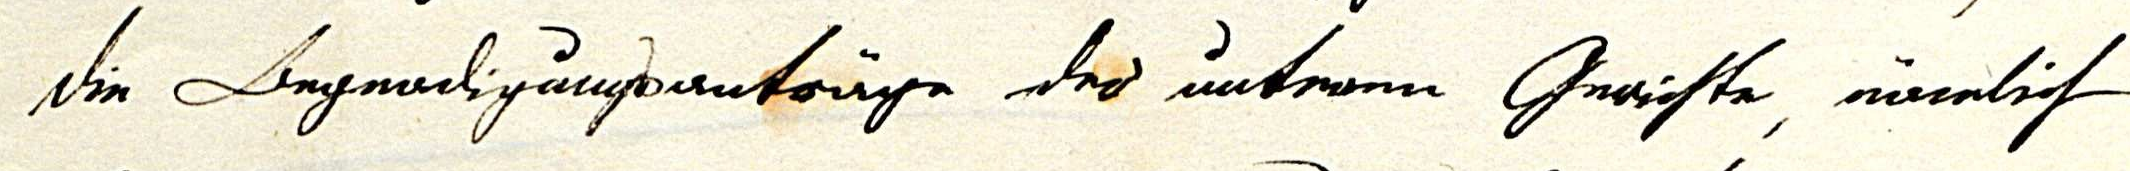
die Begnadigungsanträge der unteren Gerichte, nämlich
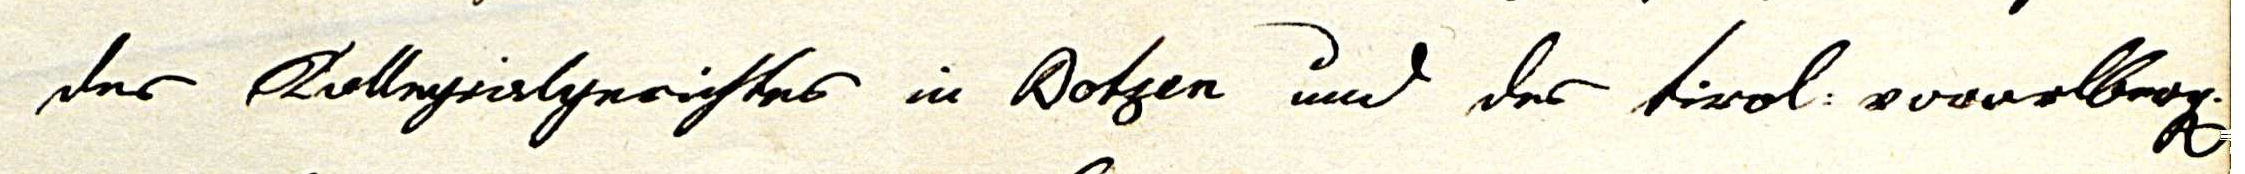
der Kollegialgerichtes in Botzen und des tirol.vorarlberg.
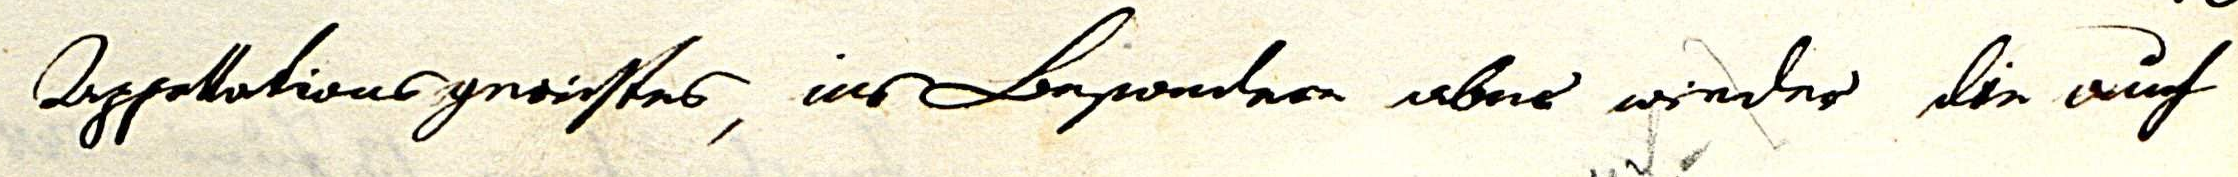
Appellationsgerichtes ins Besondere aber wieder die auch
